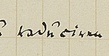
reduciren;
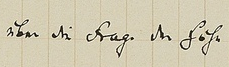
über die Frage der Höhe
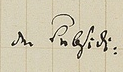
der Subsidi-
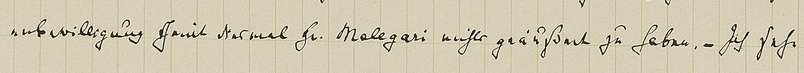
enbewilligung scheint diesmal Hr. Melegari nichts geäußert zu haben. – Ich sehe
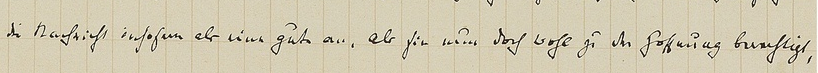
die Nachricht insofern als eine gute an, als sie nun doch wohl zu der Hoffnung berechtigt,
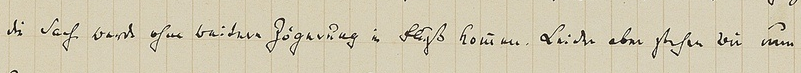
die Sache werde ohne weitere Zögerung in Fluß kommen. Leider aber stehen wir nun
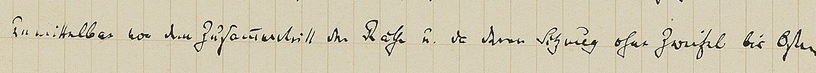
unmittelbar vor dem Zusammentritt der Räthe u. da deren Sitzung ohne Zweifel bis Ostern
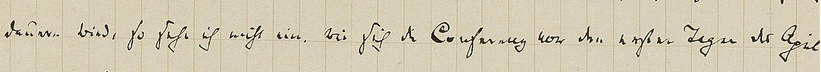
dauern wird, so sehe ich nicht ein, wie sich die Conferenz vor den ersten Tagen des April
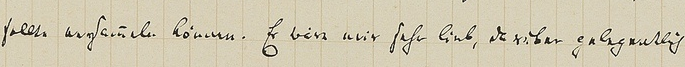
sollte versammeln können. Es wäre mir sehr lieb, darüber gelegentlich
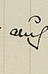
auch
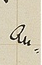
Ihre
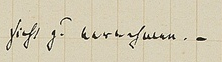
sicht zu vernehmen. –
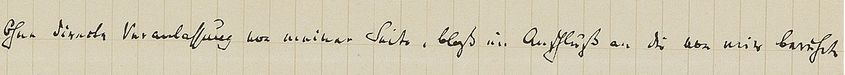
Ohne directe Veranlassung von meiner Seite, bloß im Anschluß an die von mir berührte
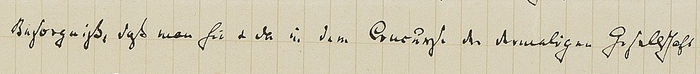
Besorgniß, daß man hie & da in dem Concurse der dermaligen Gesellschaft
